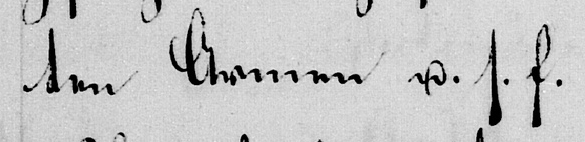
ten Armen u. s. f.
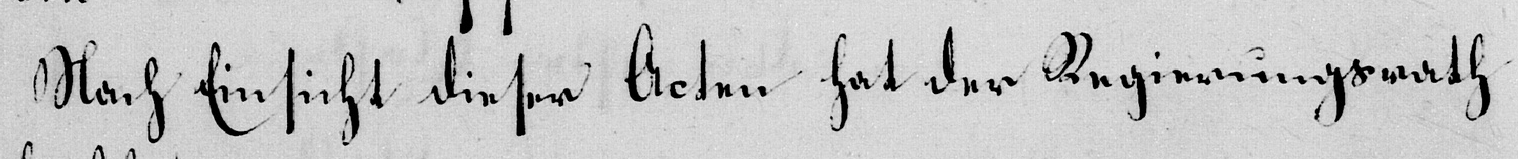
Nach Einsicht dieser Acten hat der Regierungsrath
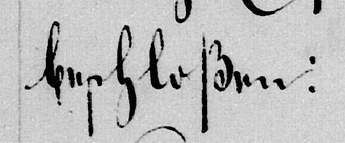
beschloßen:
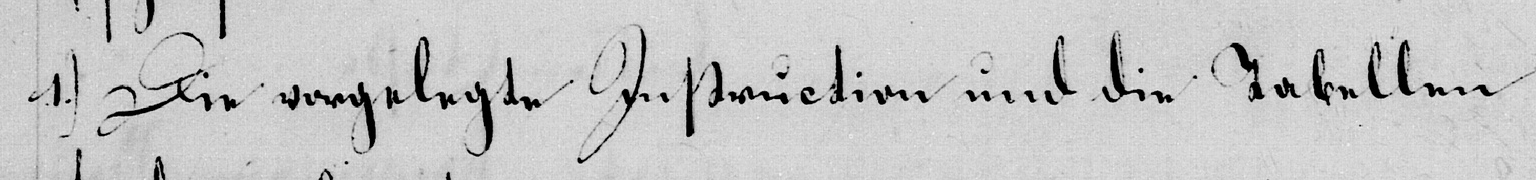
1.) Die vorgelegte Instruction und die Tabellen
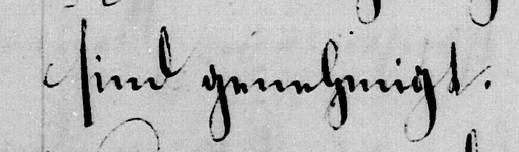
sind genehmigt.
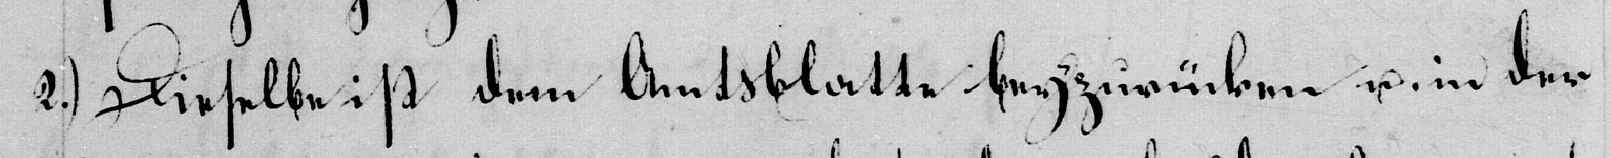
2.) Dieselbe ist dem Amtsblatte beyzurücken u. in der
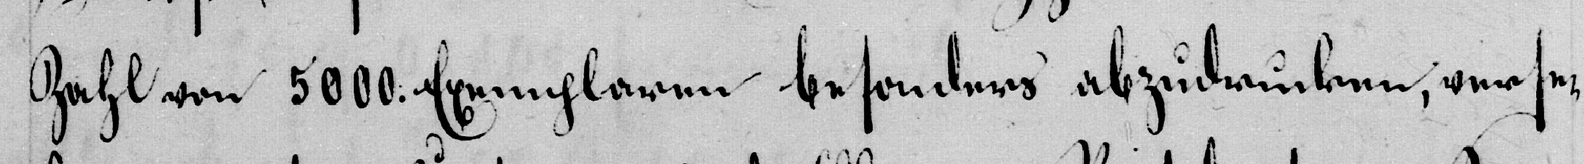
Zahl von 5000. Exemplaren besonders abzudrucken, verse¬
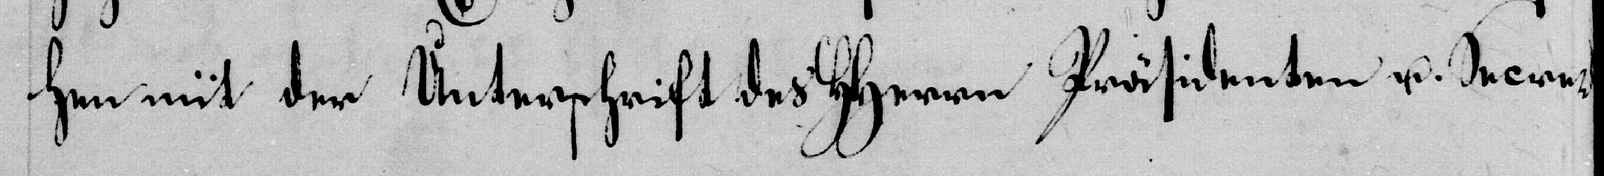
hen mit der Unterschrift des HHerrn Präsidenten u. Secre-
